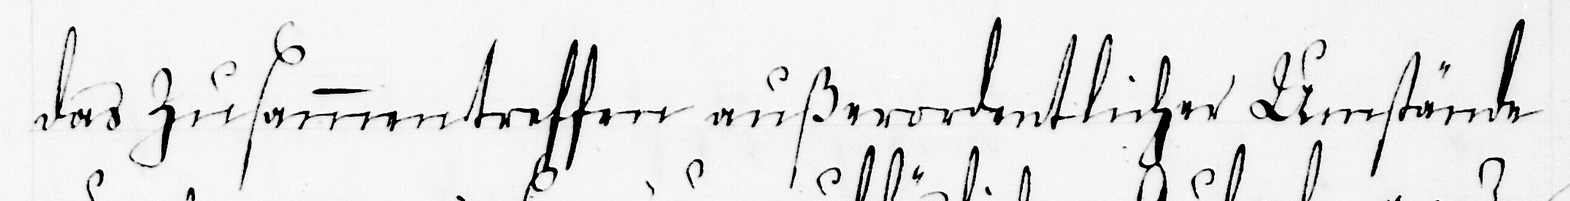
das Zusammentreffen außerordentlicher Umstände
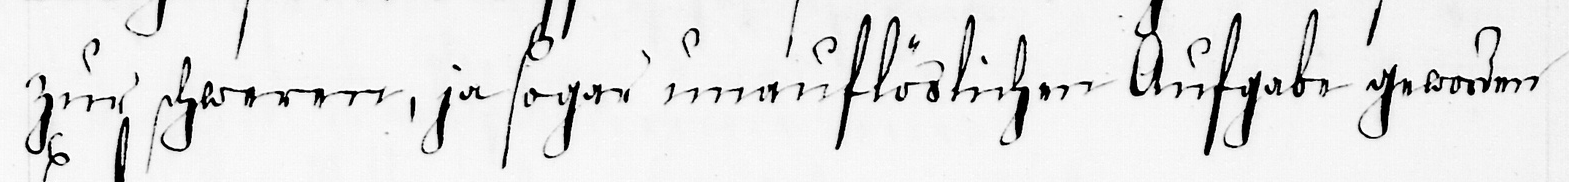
zur schweren, ja sogar unauflöslichen Aufgabe geworden
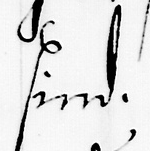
sind.
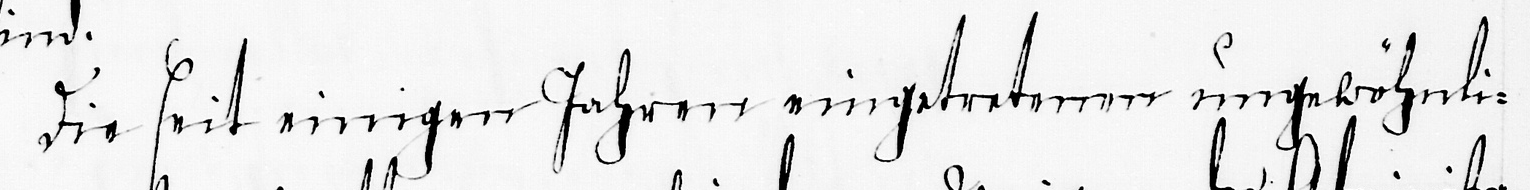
Die seit einigen Jahren eingetretenen ungewöhnli¬
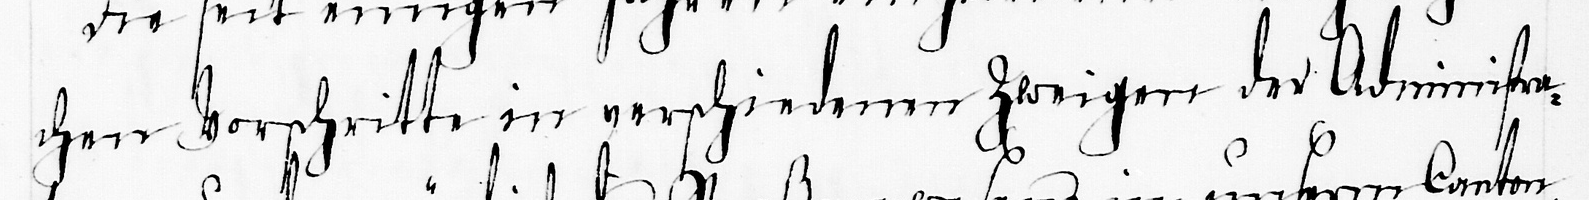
chen Vorschritte in verschiedenen Zweigen der Administra¬
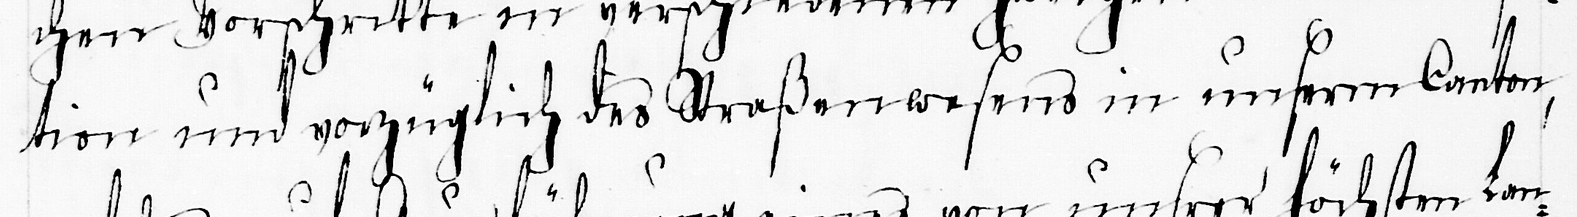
tion und vorzüglich des Straßenwesens in unserm Canton,
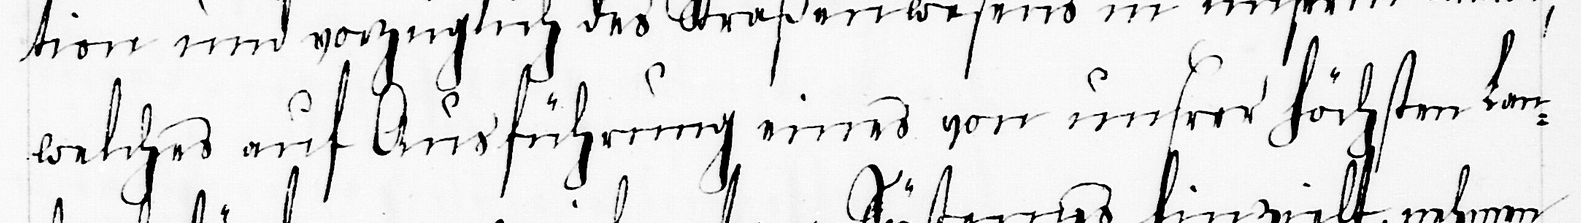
welches auf Ausführung eines von unsrer höchsten Lan¬
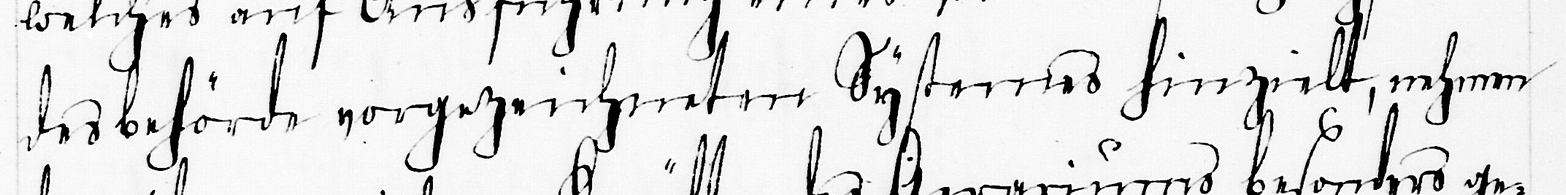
desbehörde vorgezeichneten Systemes hinzielt, nehmen
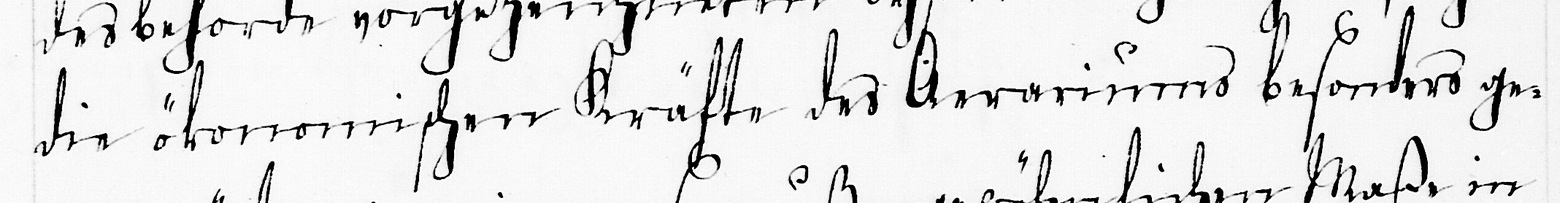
die ökonomischen Kräfte des Aerariums besonders ge¬
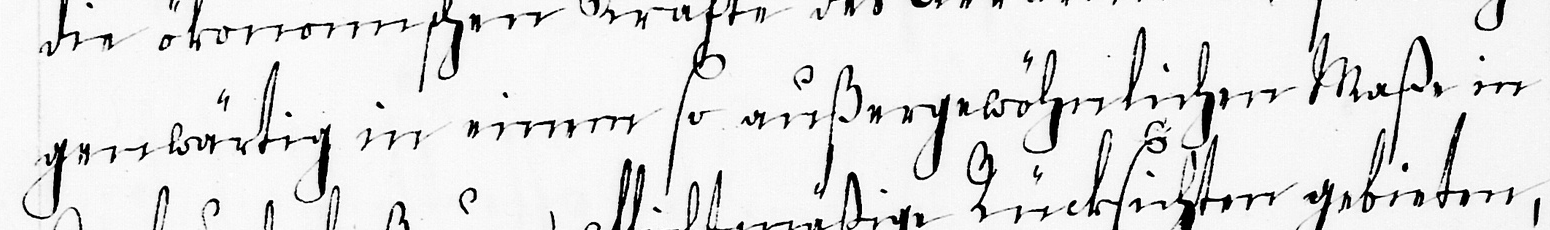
genwärtig in einem so außergewöhnlichen Maße in
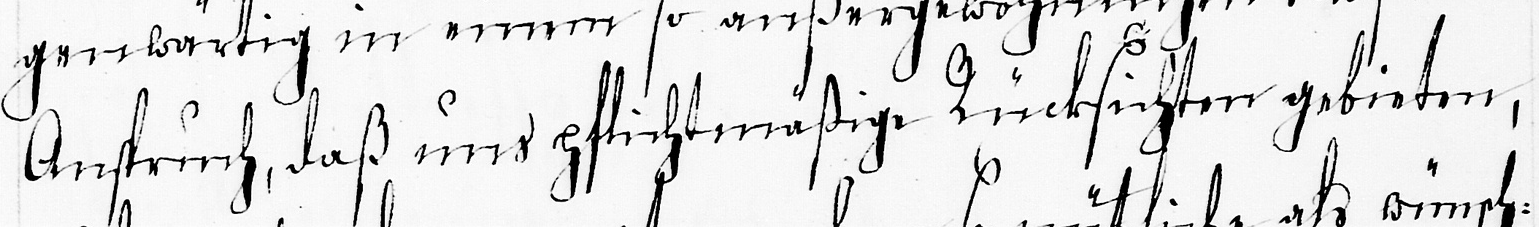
Anspruch, daß uns pflichtmäßige Rücksichten gebieten,
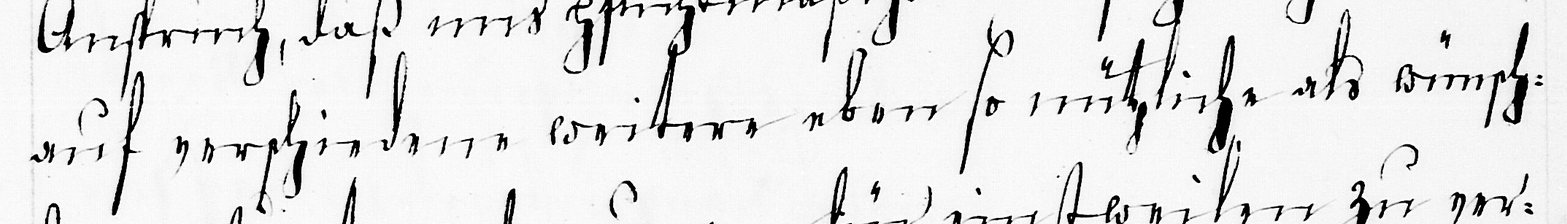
auf verschiedene weitere eben so nützliche als wünsch¬
